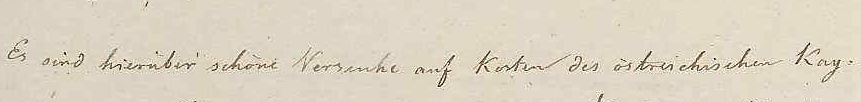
Es sind hierüber schöne Versuche auf Kosten des östreichischen Kay-
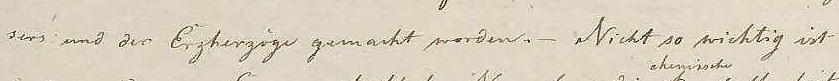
sers und der Erzherzöge gemacht worden. – Nicht so wichtig ist
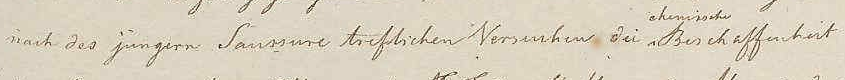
nach des jüngern Saussure treflichen Versuchen die chemische Beschaffenheit
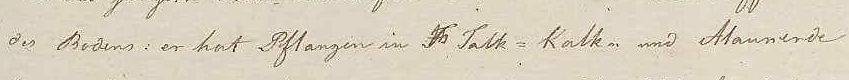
des Bodens: er hat Pflanzen in F Talk-Kalken und Alaunerde
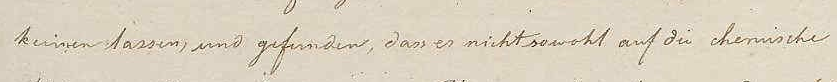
keimen lassen, und gefunden, dass es nicht sowohl auf die chemische
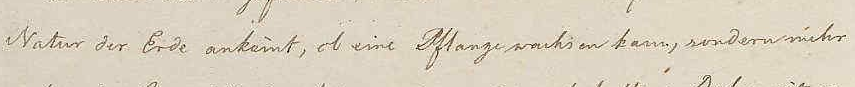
Natur der Erde ankömt, ob eine Pflanze wachsen kann, sondern mehr
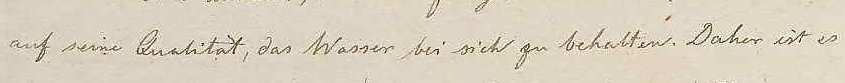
auf seine Qualität, das Wasser bei sich zu behalten. Daher ist es
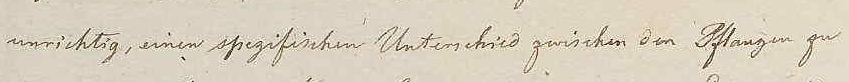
unrichtig, einen spezifischen Unterschied zwischen den Pflanzen zu
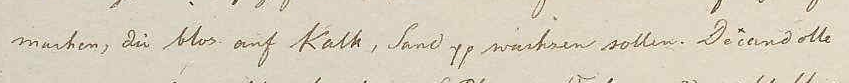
machen, die blos auf Kalk, Sand pp wachsen sollen. Decandolle
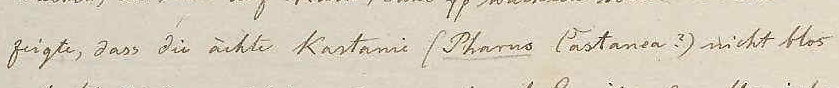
zeigte, dass die ächte Kastanie nicht blos
